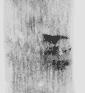三
